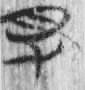○（得）
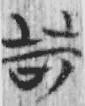苛
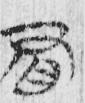冒
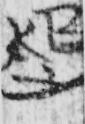○（宣）
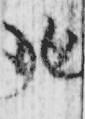卯
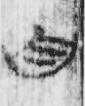自
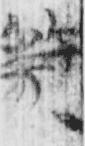殺
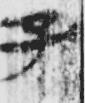子
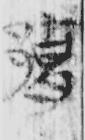○（宛）
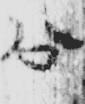公
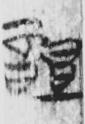○（屬）
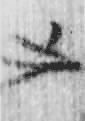之
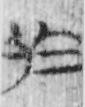於
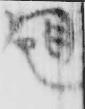陰
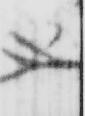之
